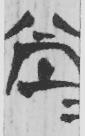坣=
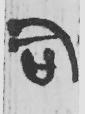司
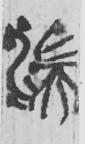湍
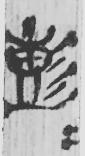彭=
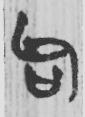句
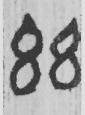兹
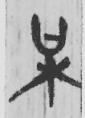某
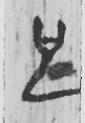也
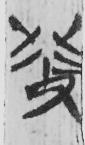發
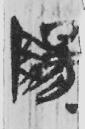陽
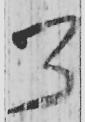乃
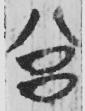予
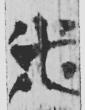釆
